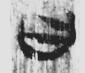曰
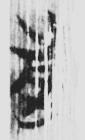前
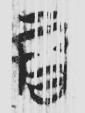冬
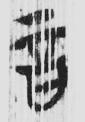言
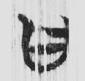曰
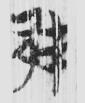邦
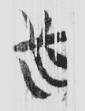必
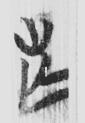○（丧）
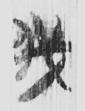我
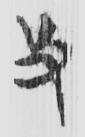及
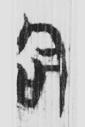含（今）
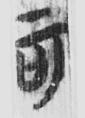可（何）
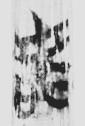若
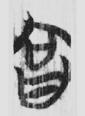○（答）
